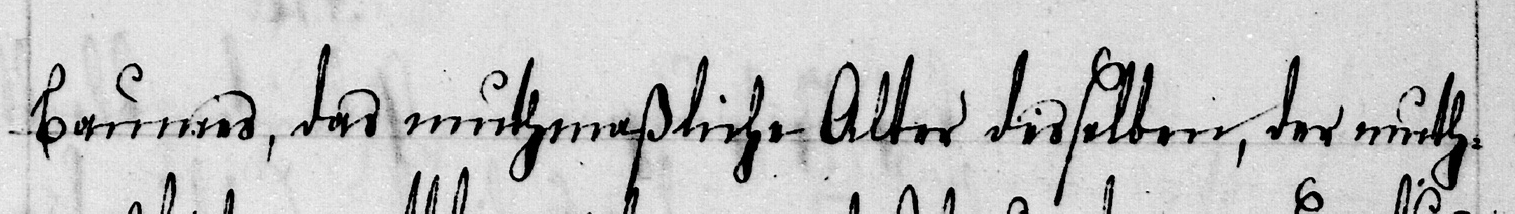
Baumes, das muthmaßliche Alter desselben, der muth¬
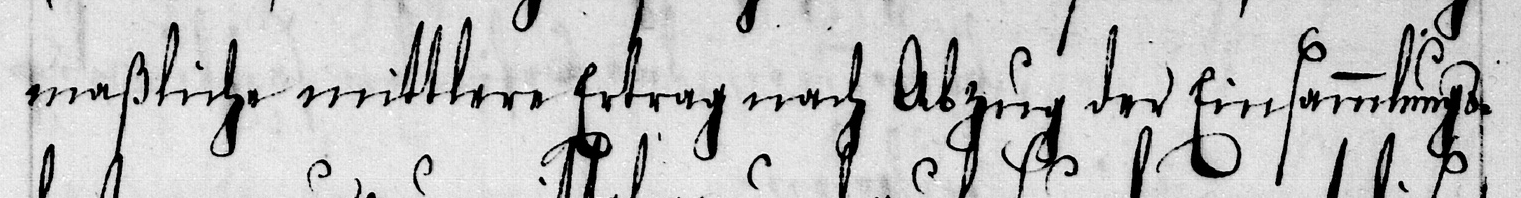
maßliche mittlere Ertrag nach Abzug der Einsammlungs¬
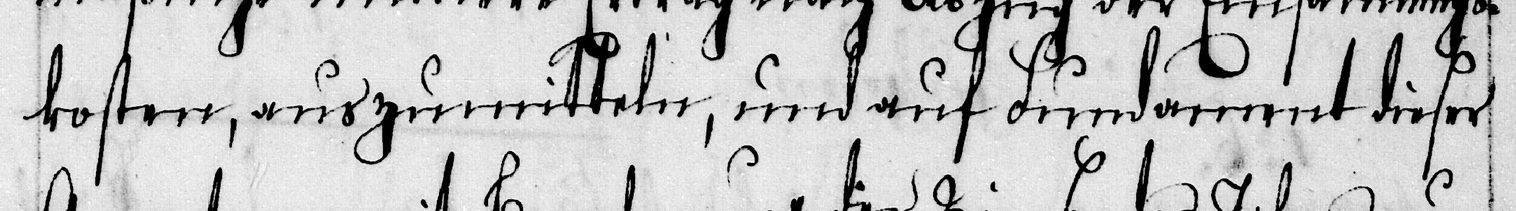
kosten, auszumitteln, und auf Fundament dieser
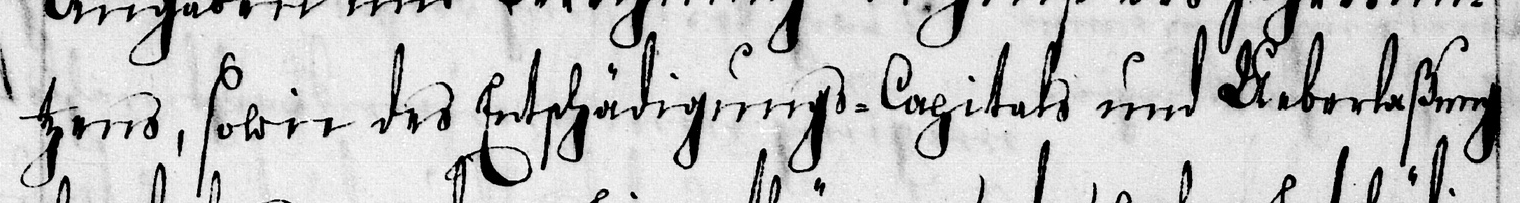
tzens, sowie des Entschädigungs-Capitals und Ueberlaßung
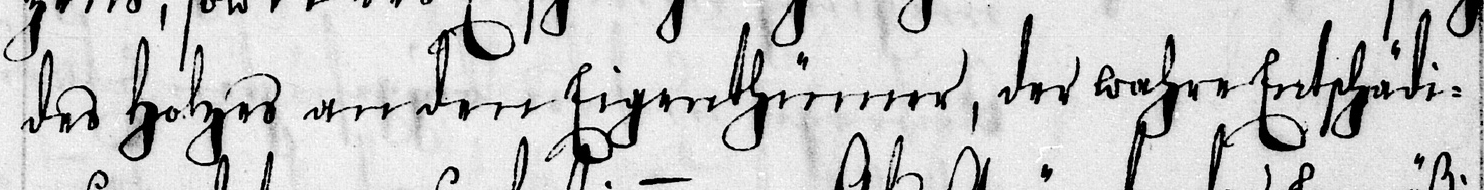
des Holzes an den Eigenthümer, der wahre Entschädi¬
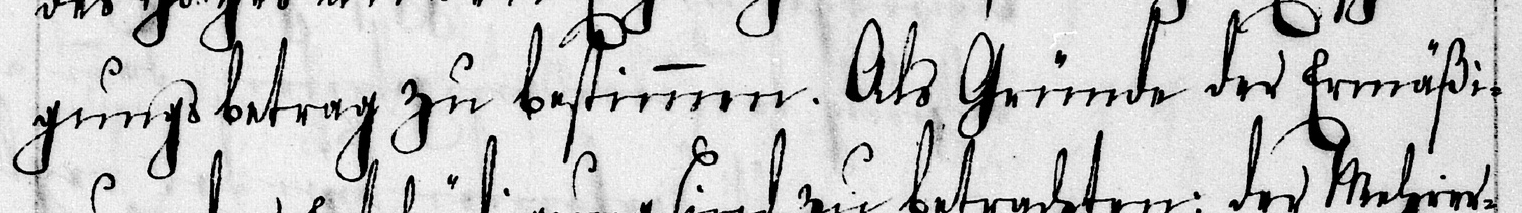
gungsbetrag zu bestimmen. Als Gründe der Ermäßi¬
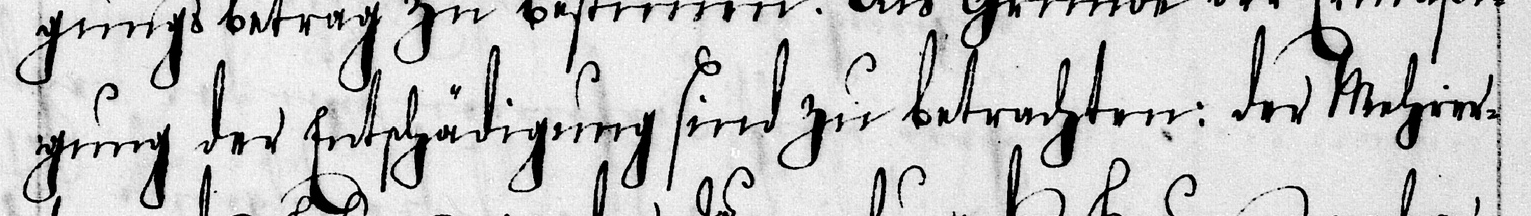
gung der Entschädigung sind zu betrachten: der Mehrer¬
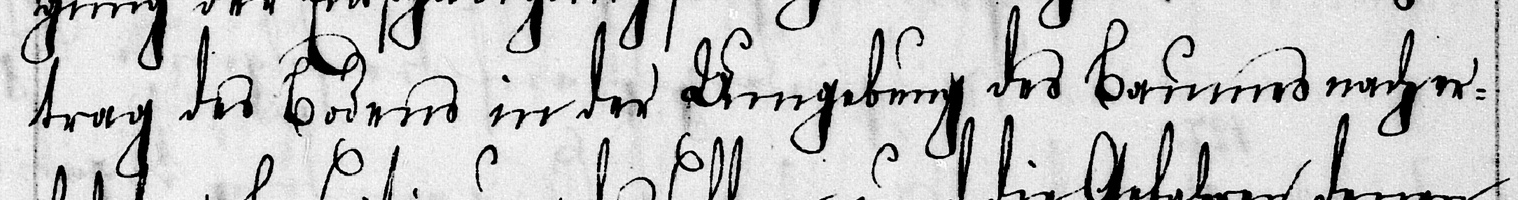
trag des Bodens in der Umgebung des Baumes nach er¬
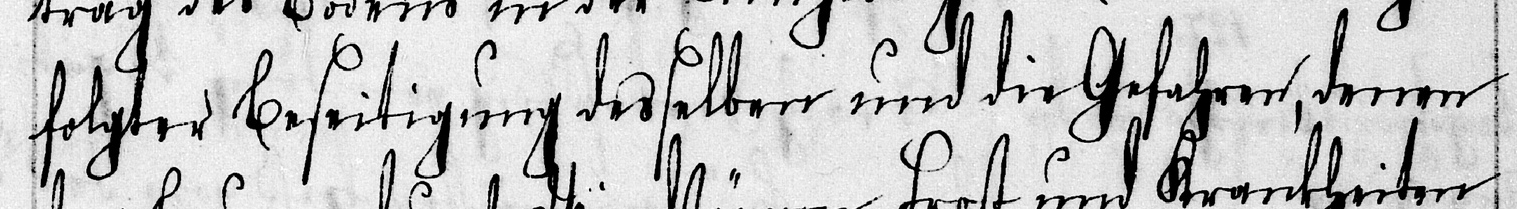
folgter Beseitigung desselben und die Gefahren, denen
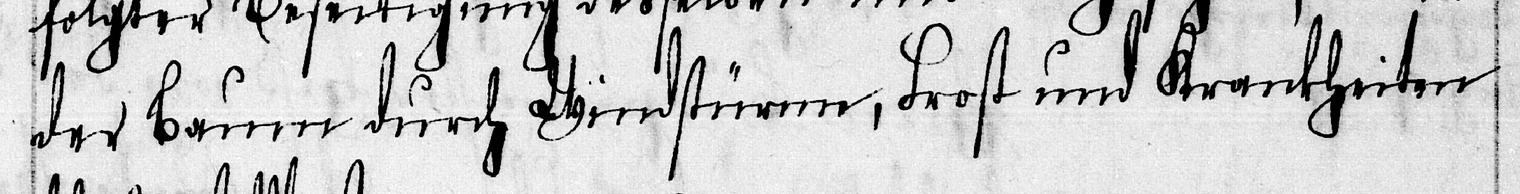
der Baum durch Windstürme, Frost und Krankheiten
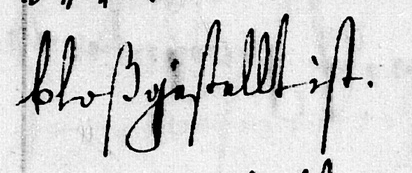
bloßgestellt
